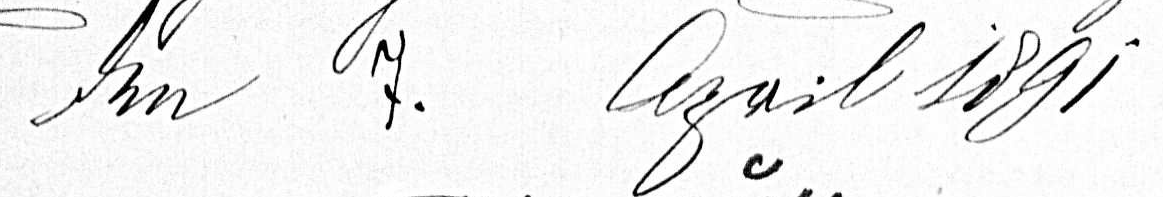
Den 7. April 1891
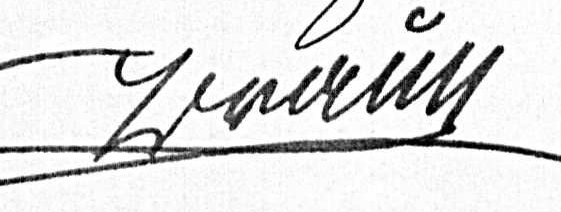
Wraun
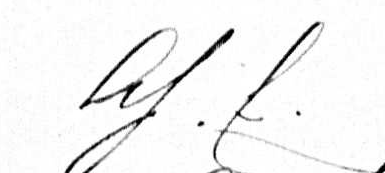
Ah E
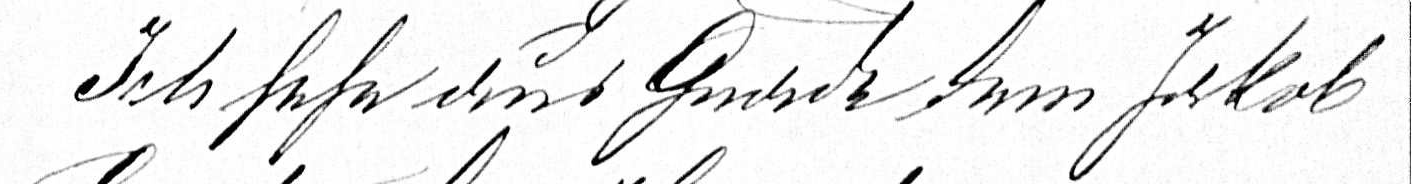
Ich sehe aus Gnade dem Jakob
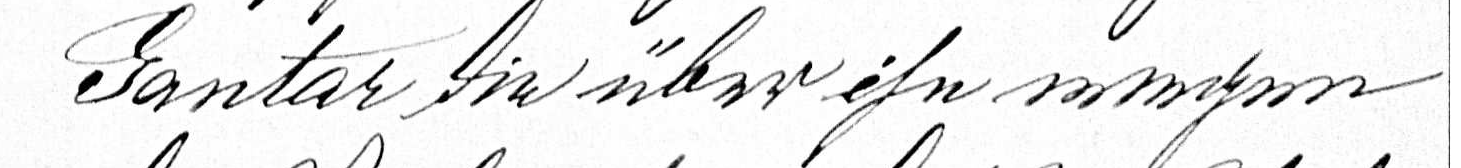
Gantar die über ihn wegen
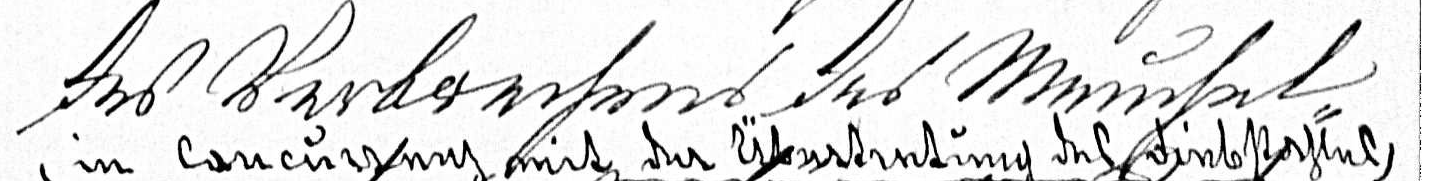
des Verbrechens des Meuchel¬
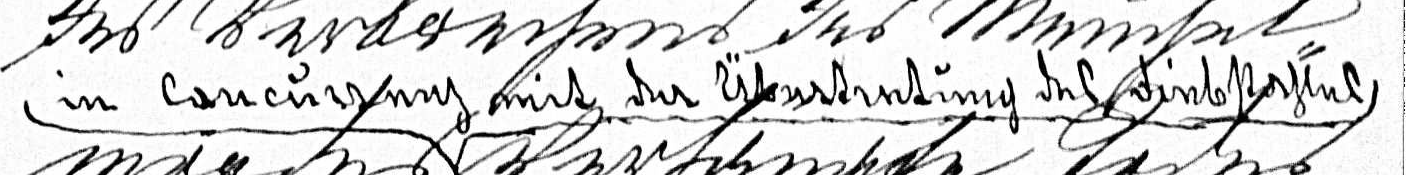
in Concurrenz mit der Übertretung des Diebstahles
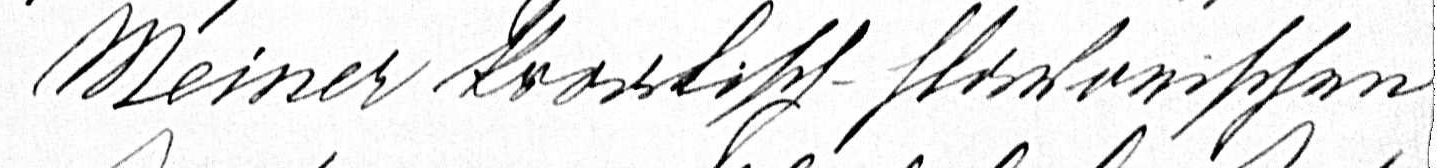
Meiner kroatisch-slavonischen
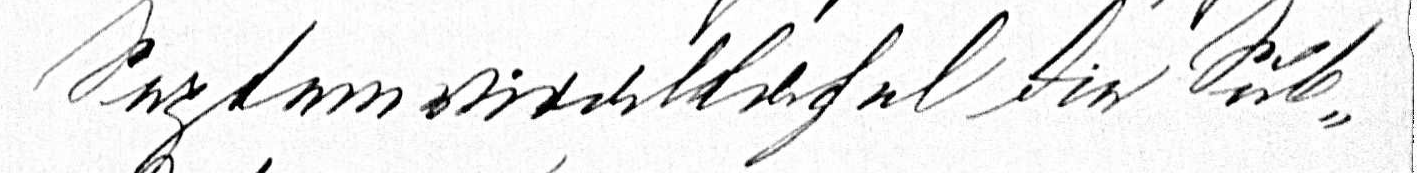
Septemviraltafel die Sub¬
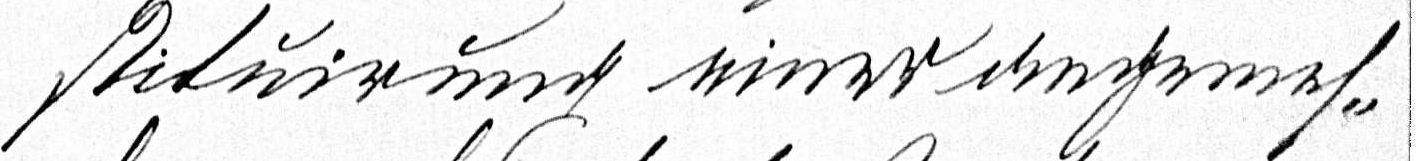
stituirung einer angemes¬
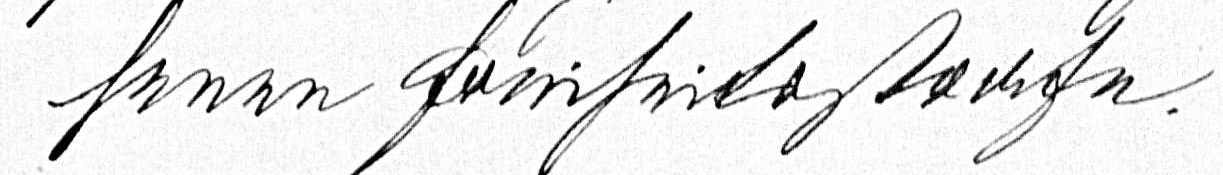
senen Freiheitsstrafe
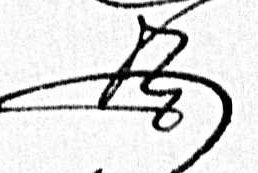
FJ
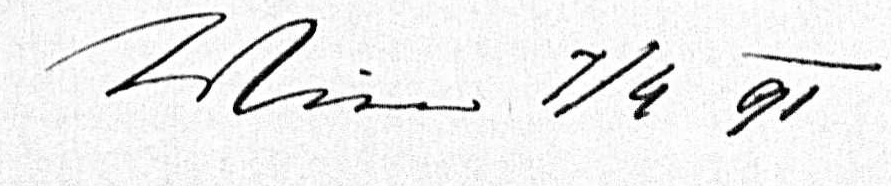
Wien 7/4 1891
